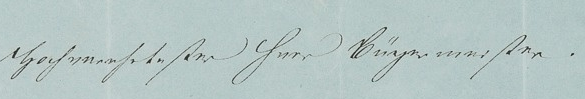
Hochverehrtester Herr Bürgermeister!
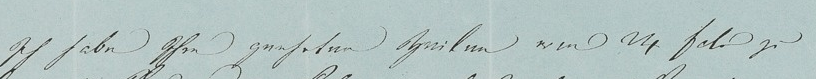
Ich habe Ihre geehrten Zeilen vom 24 Febr zu
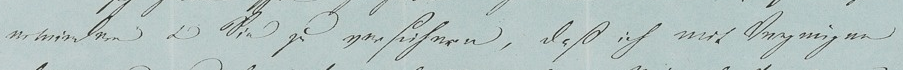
erwiedern & Sie zu versichern, daß ich mit Vergnügen
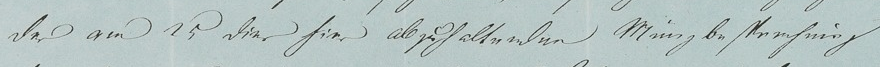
der am 25 dies hier abzuhaltenden Münzbesprechung
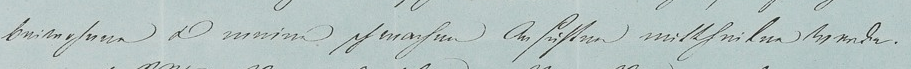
bewohnen & meine schwachen Ansichten mittheilen werde.
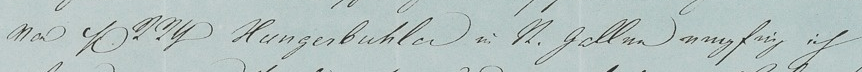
Von Herrn RRth Hungerbuhler in St. Gallen empfing ich
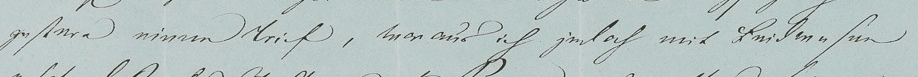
gestern einen Brief, woraus ich jedoch mit Leidwesen
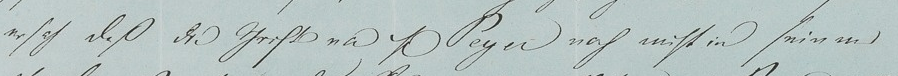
ersah daß die Schrift von Herrn Peyer noch nicht in seinen
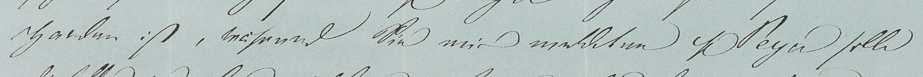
Handen ist, während Sie mir meldeten Herr Peyer solle
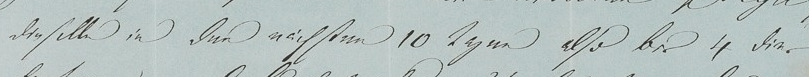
dieselbe in den nächsten 10 Tagen also bis 4 dies
